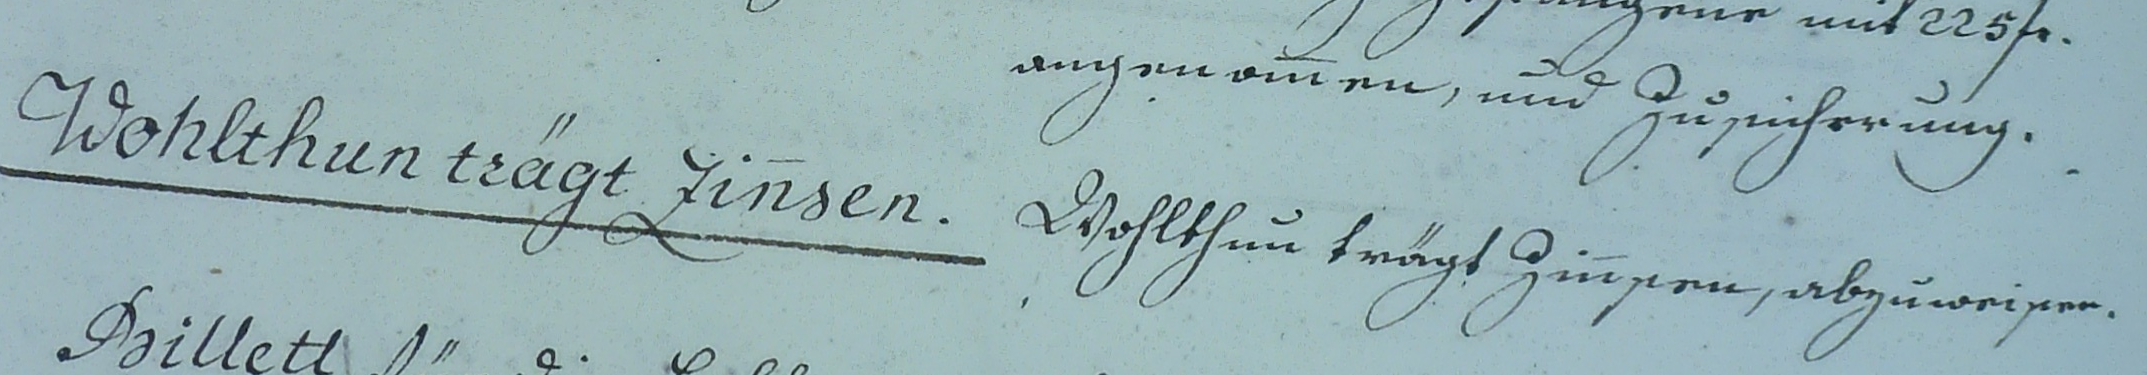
Wohlthun trägt Zin̅sen. Wohlthun trägt Zin̅sen, abzuweisen.
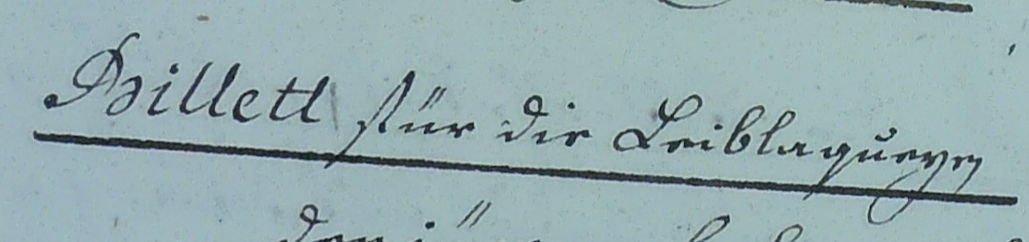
Billett für die Leiblaqueyen
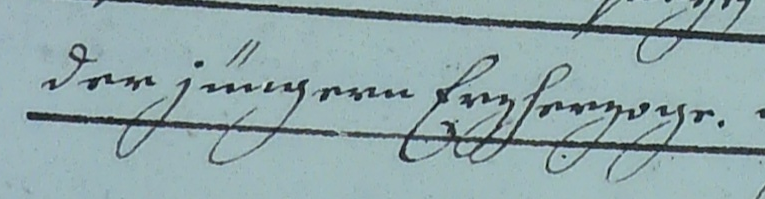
der jüngern Erzherzoge.
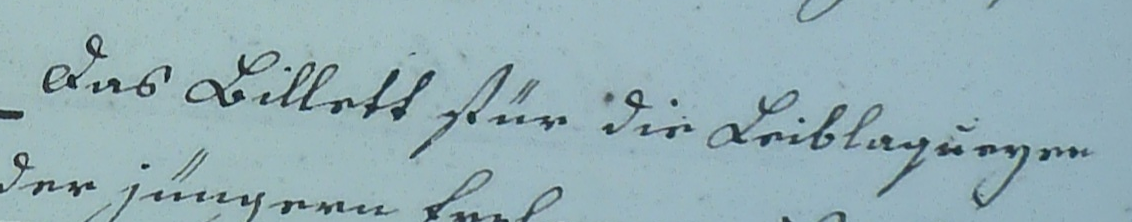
Das Billett für die Leiblaqueyen
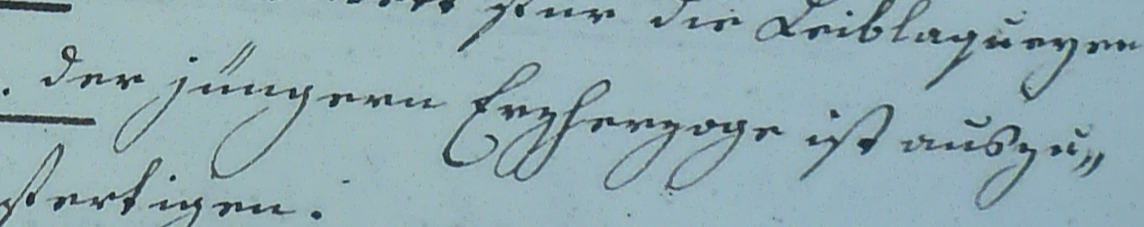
der jüngern Erzherzoge ist auszu¬
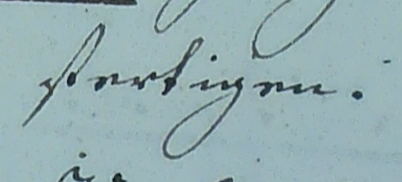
fertigen.
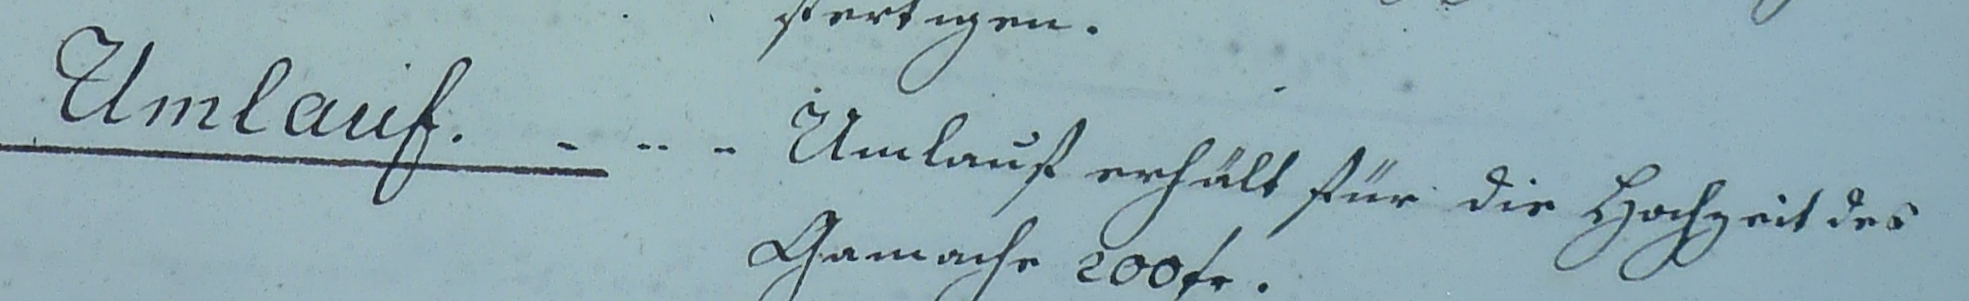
Umlauf. .. .. .. Umlauf erhält für die Hochzeit des
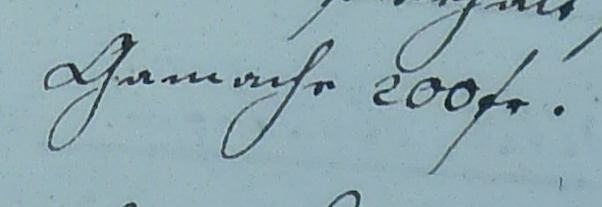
Gamache 200fr.
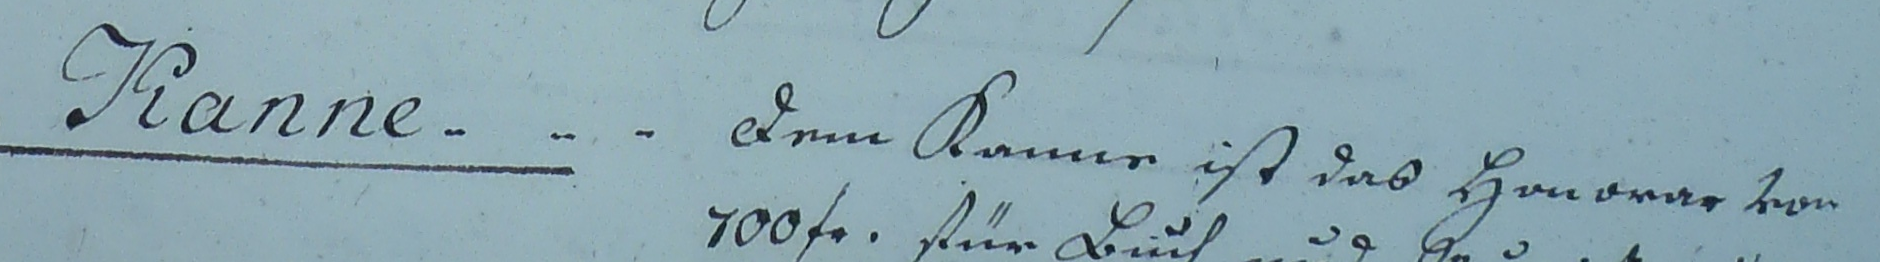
Kanne .. .. .. Dem Kanne ist das Honorar von
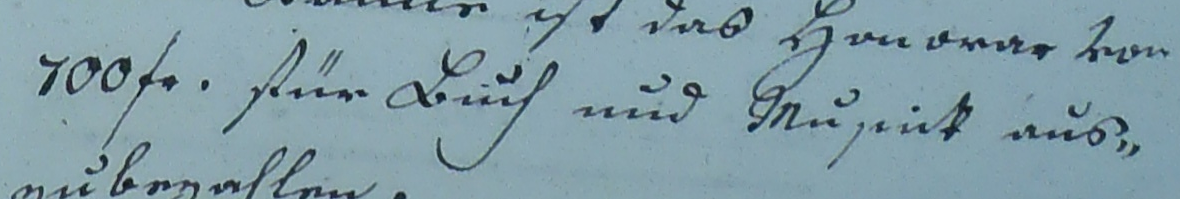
700fr. für Buch und Musik aus¬
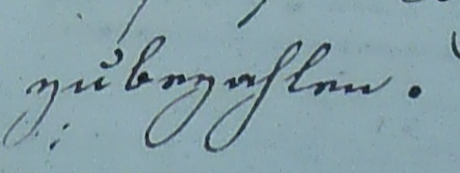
zubezahlen.
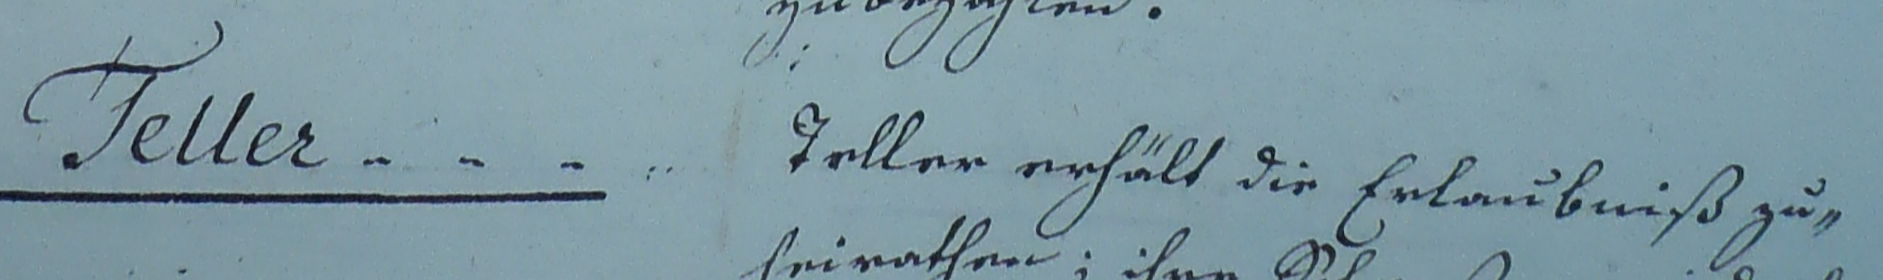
Teller .. .. .. .. Teller erhält die Erlaubniß zu¬
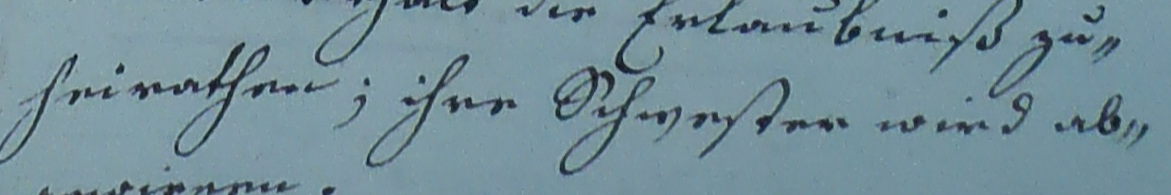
heirathen; ihre Schwester wird ab¬
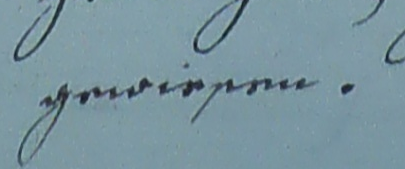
gewiesen.
